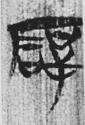厚
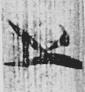之
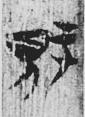○（重）
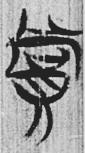賞
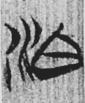泊（薄）
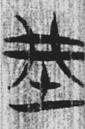○（刑）
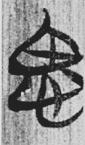思
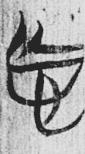忘
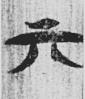亓
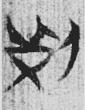死
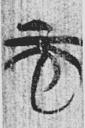而
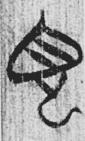見
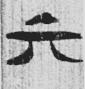亓
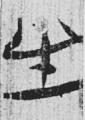生
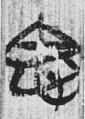思
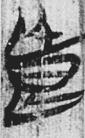良
